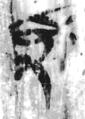𠭁
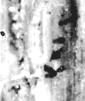西
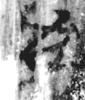兇（凶）
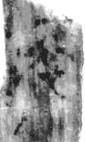疾
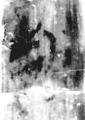朝
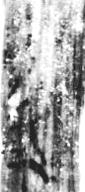閟（閉）
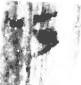夕
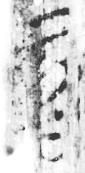啟
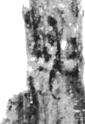朝
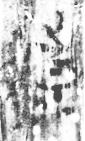逃（盜）
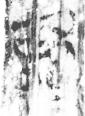○（得）
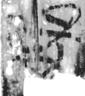𠭁
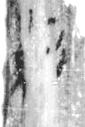死
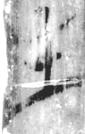生
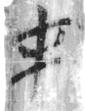才（在）
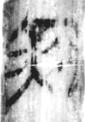寅
